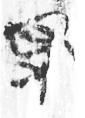𠭁
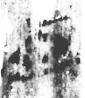西
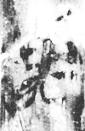○（聞）
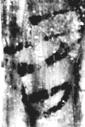言
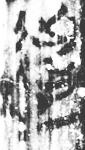逃（盜）
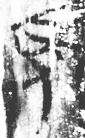○（得）
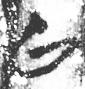㠯（以）
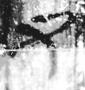又（有）
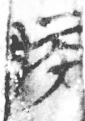疾
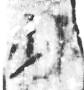少
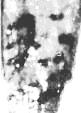翏（瘳）
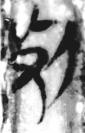死
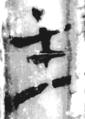生
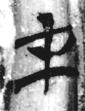才（在）
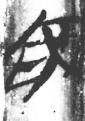寅
